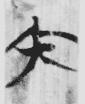內
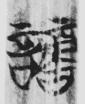謫
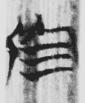於
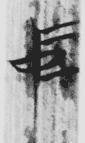𠁩
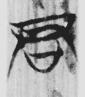君
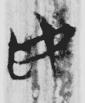女
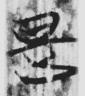是
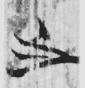之
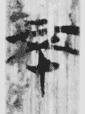不
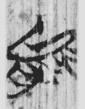能
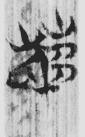茅
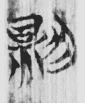則
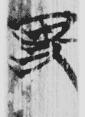卑
